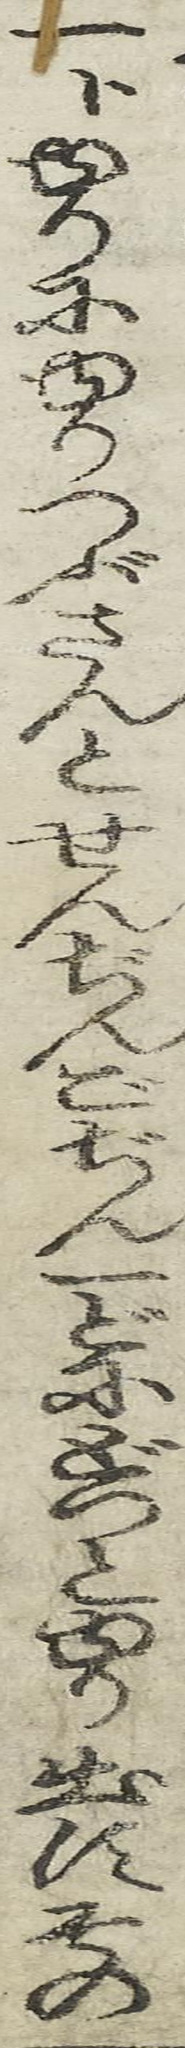一トゆりにゆりつぶさんとせんぢんごぢん一どにどつとゆり出すその
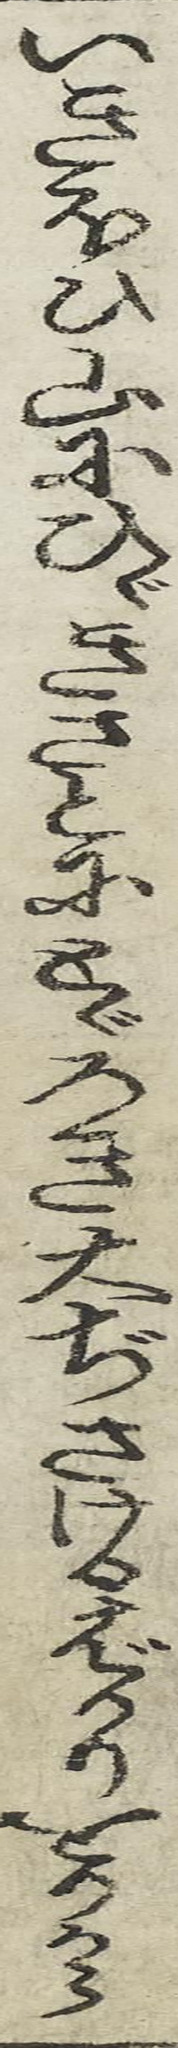いきほひ山にひゞきさとにとゞろき大ぢさけるばかりをりから
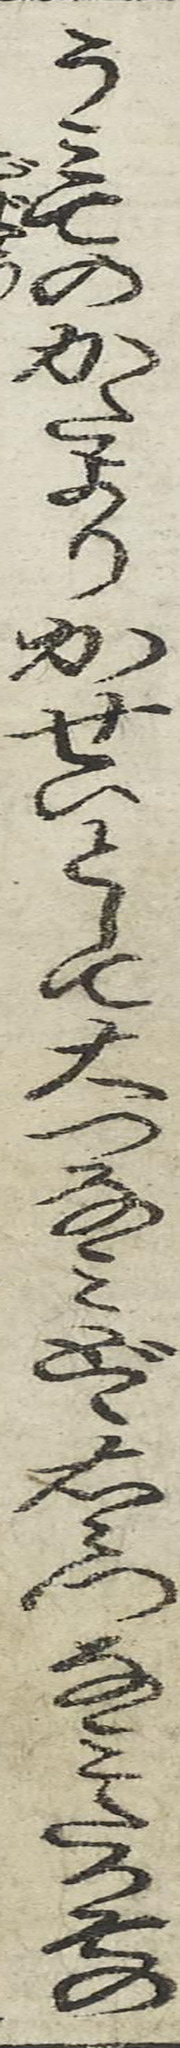うみてのかたよりかせいとして大つなみどゝ右衛門なみたつその
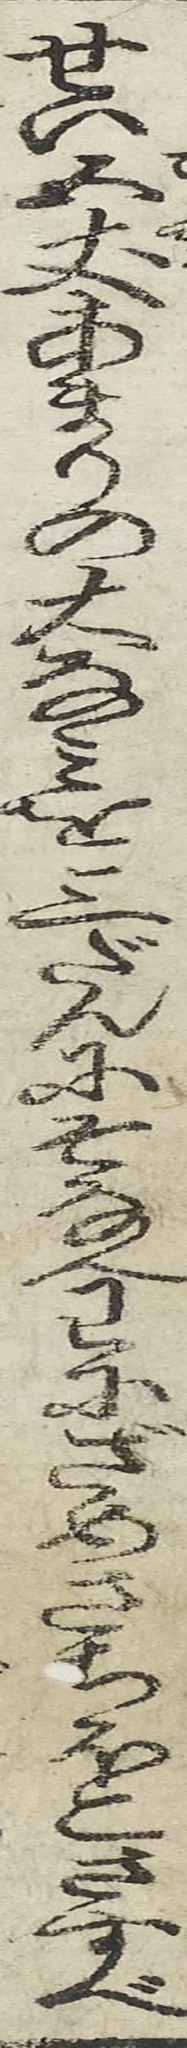せい五丈あまりの大なみを三だんにそなへわにざめさちほこさすべ
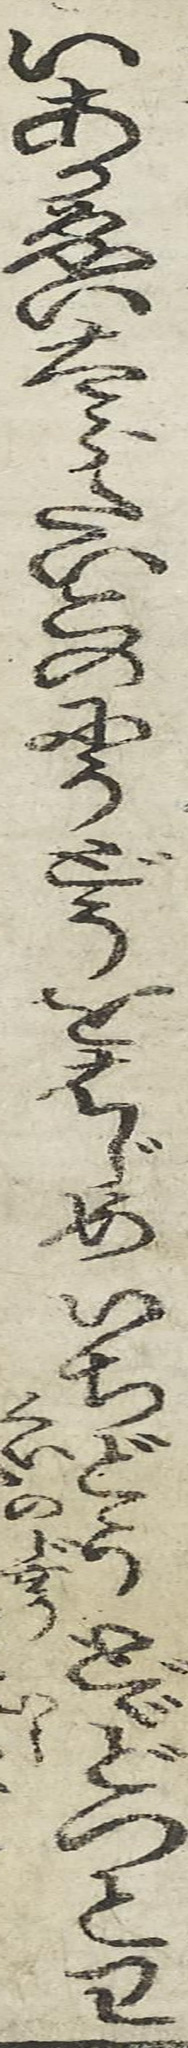いあかゑい太郎たいこのにうどうをはじめいちどうどゞどつとわ
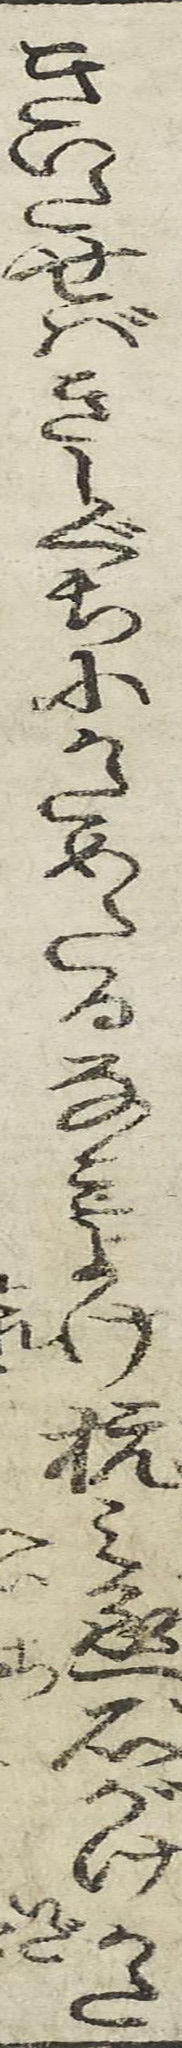きいたせばきしぐちにかためたるなみよけ杭之丞石がけかた
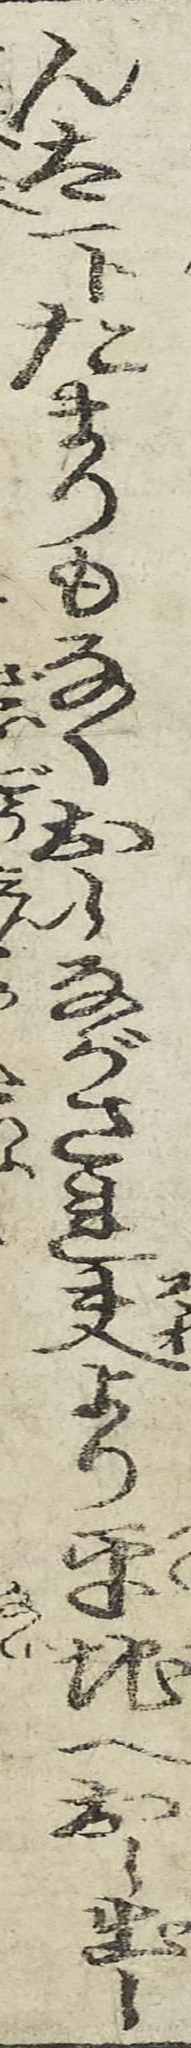ん太一トたまりもなくおしながされ夫より平地へおし出し
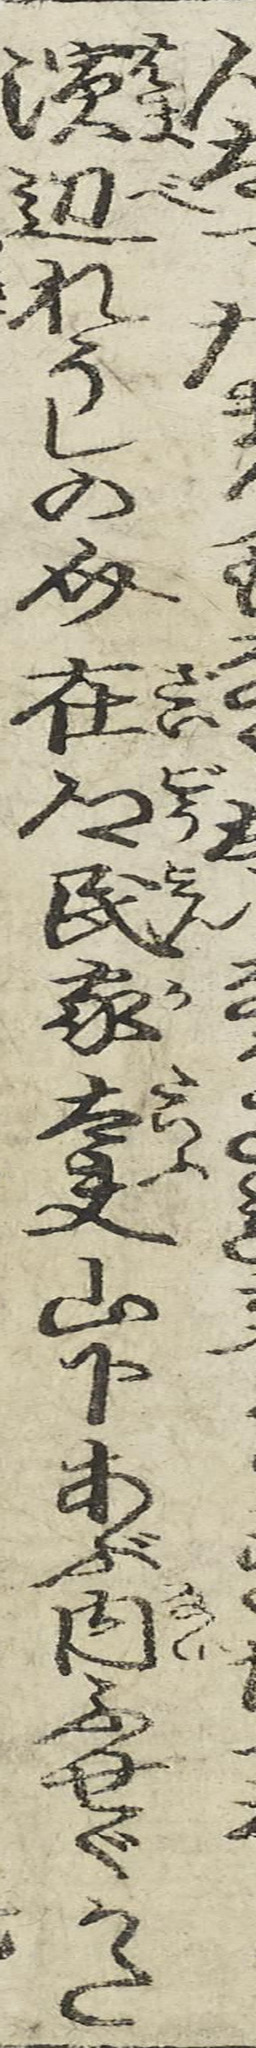濱辺れうしの介在郷民家太夫山下あぶ内ふせぐかた
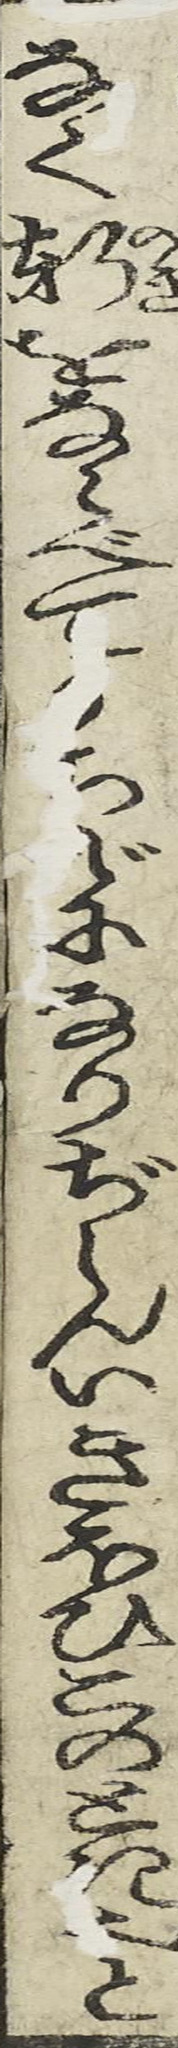なく軒をならべてうちじになりぢしんいきほひこのとき也と
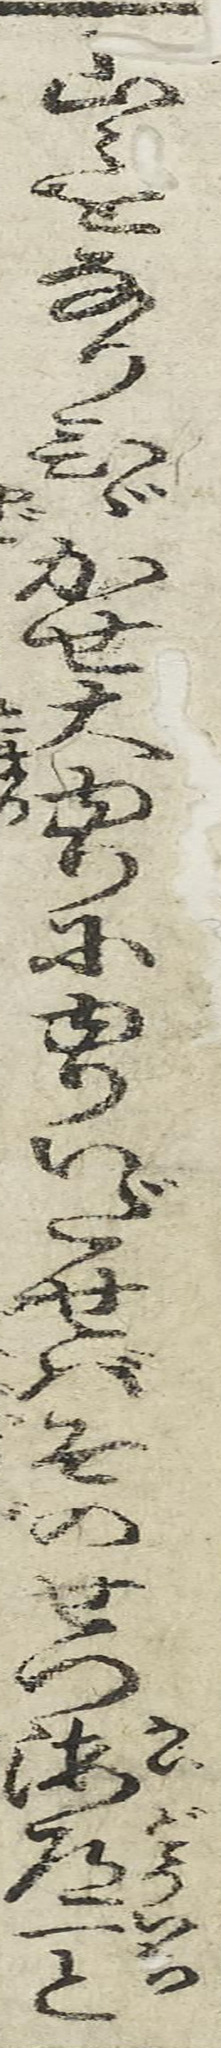山〻をなりひゞかせ大ゆりにゆりいだせばそのせつ海道一と
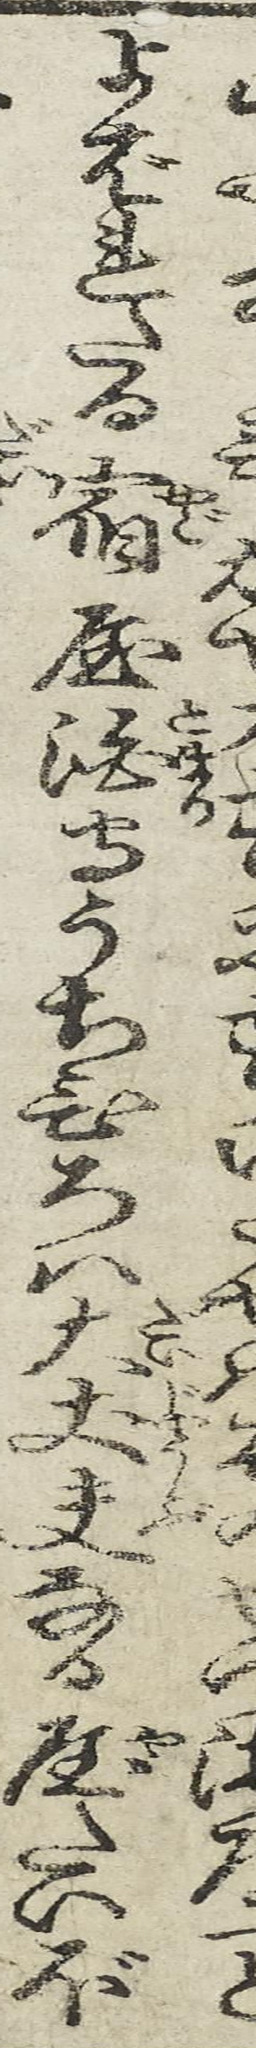よばれたる宿屋泊寺うちひろは大丈夫なる屋たいぼ
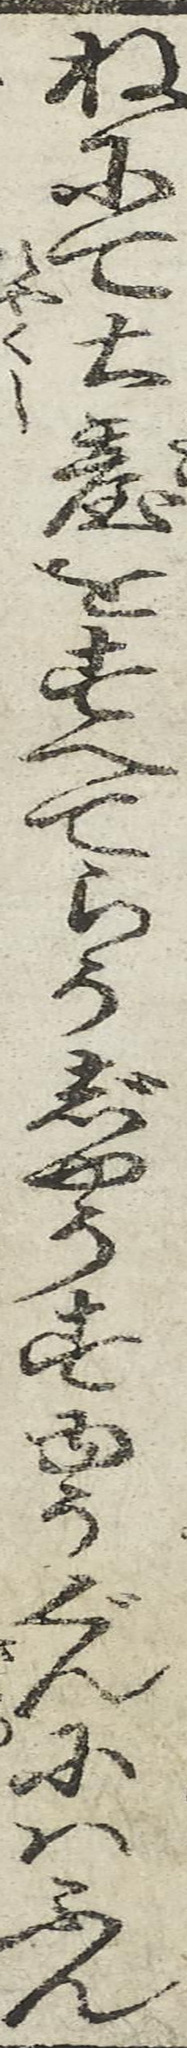ねにて土臺をすへてらうじやうすゆうぐんにはふん
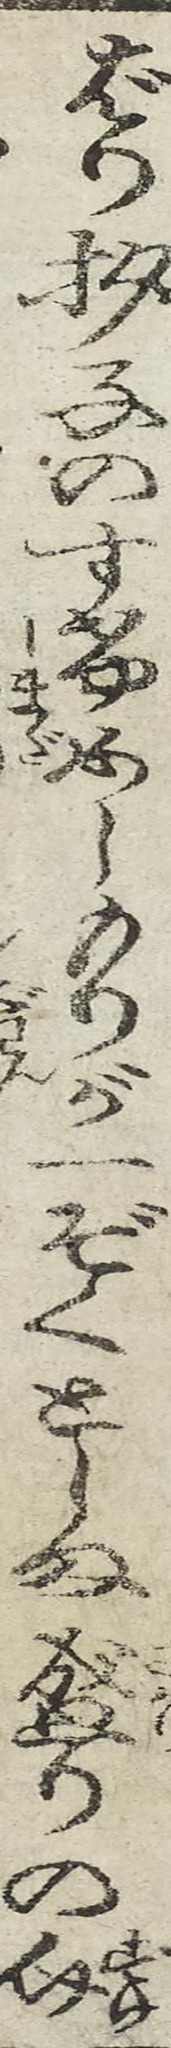ばり杓子のすけめしもりが一ぞくとしま盛りの介
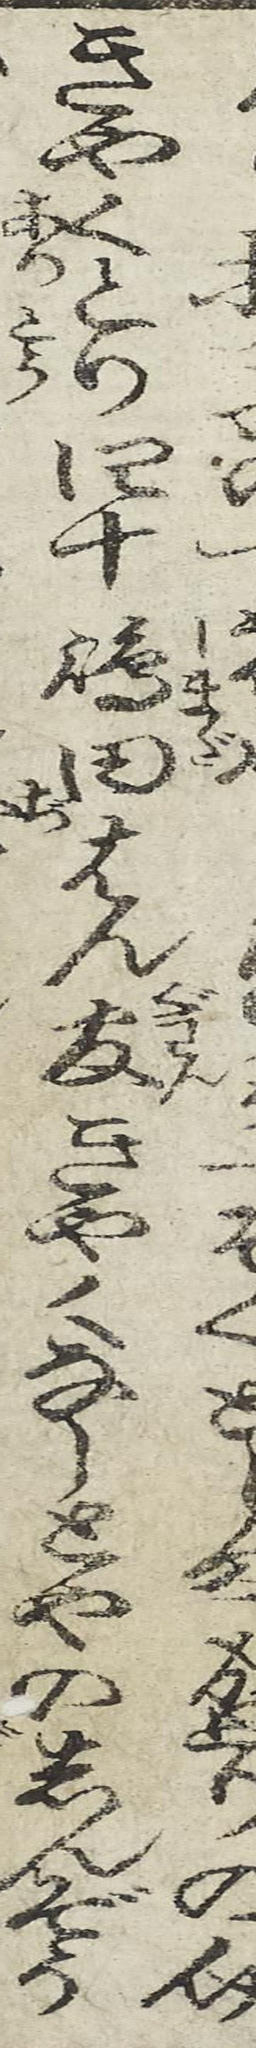きやくとり四十嶋田はん官きやくなしとやのしんぞう
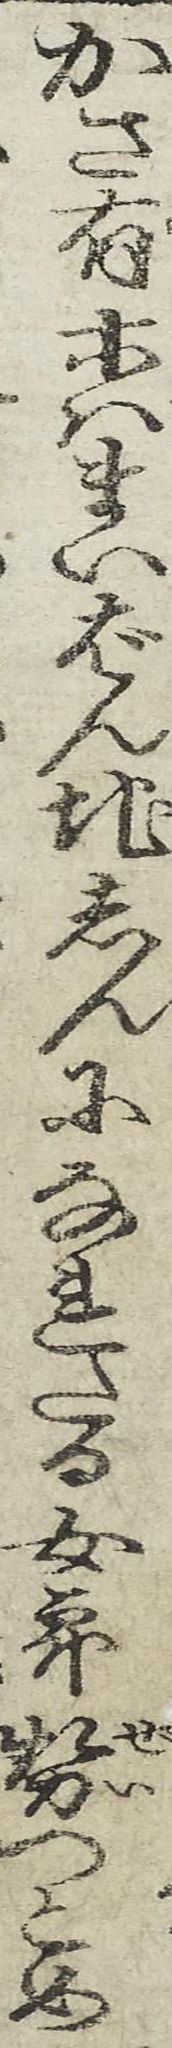かさ有等はまいばん地しんになれたる女郎勢つとめ
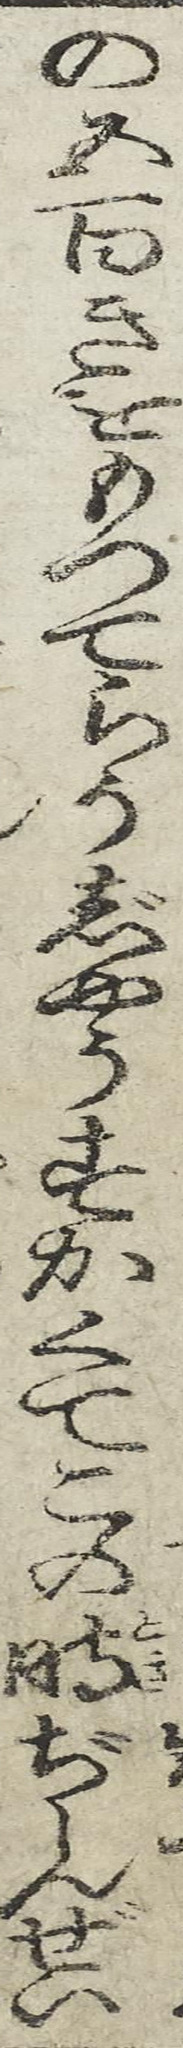の五百きをもつてらうじやうすかくてこの時ぢしんぜい
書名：新板ぢしん太平記
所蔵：東京大学地震研究所図書室 Earthquake Research Institute Library, The University of Tokyo, JAPAN
